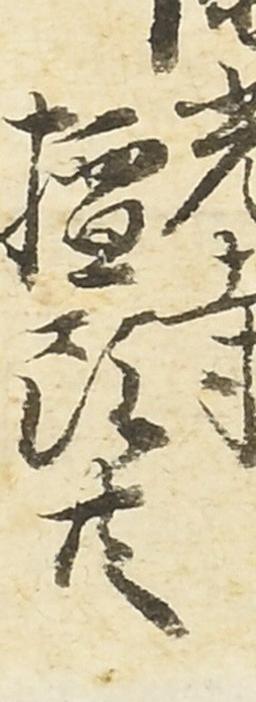檀頭共

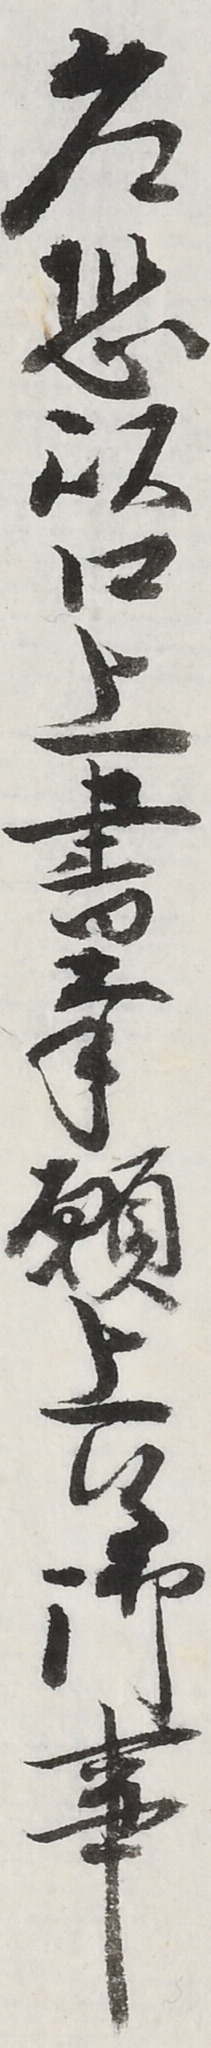乍恐以口上書奉願上候御事
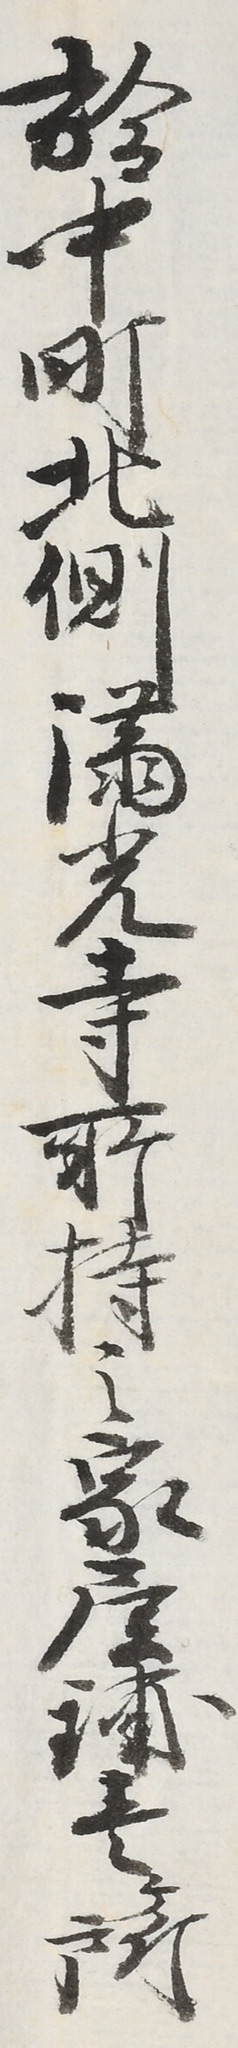於中町北側満光寺所持之家屋跡壱ケ所
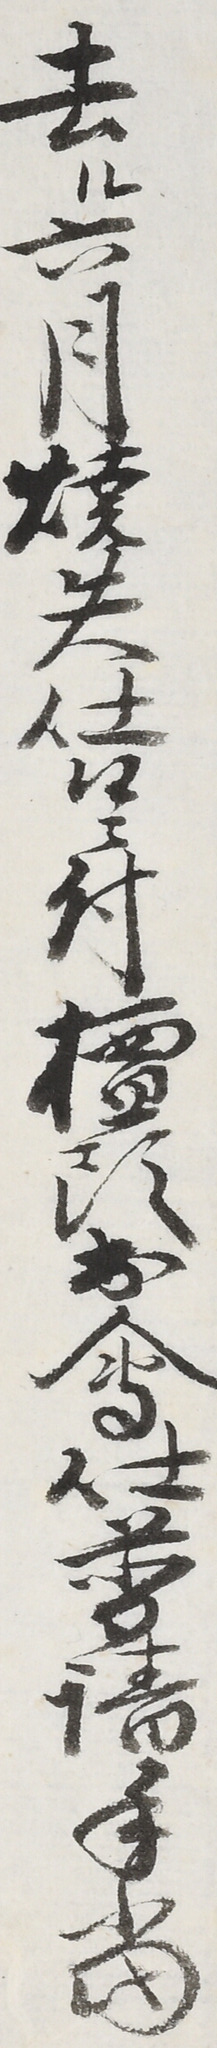去ル六月焼失仕候ニ付檀頭出会仕普請手当
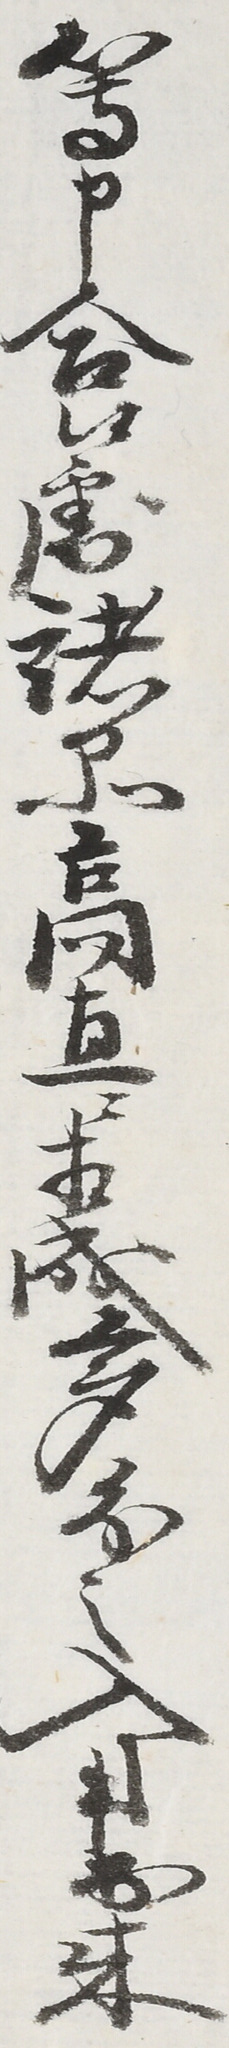等申合候処諸品高直ニ相成多分之入用出来
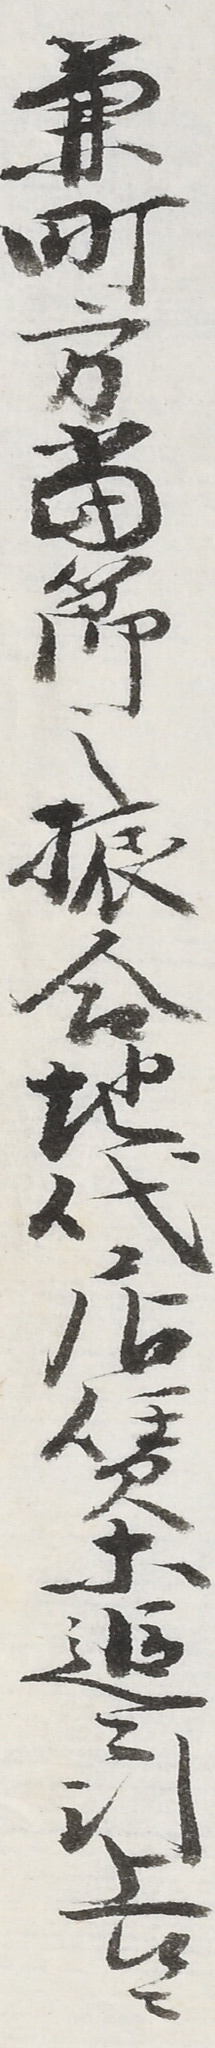兼町方当節之振合地代店賃等追々引上候ニ
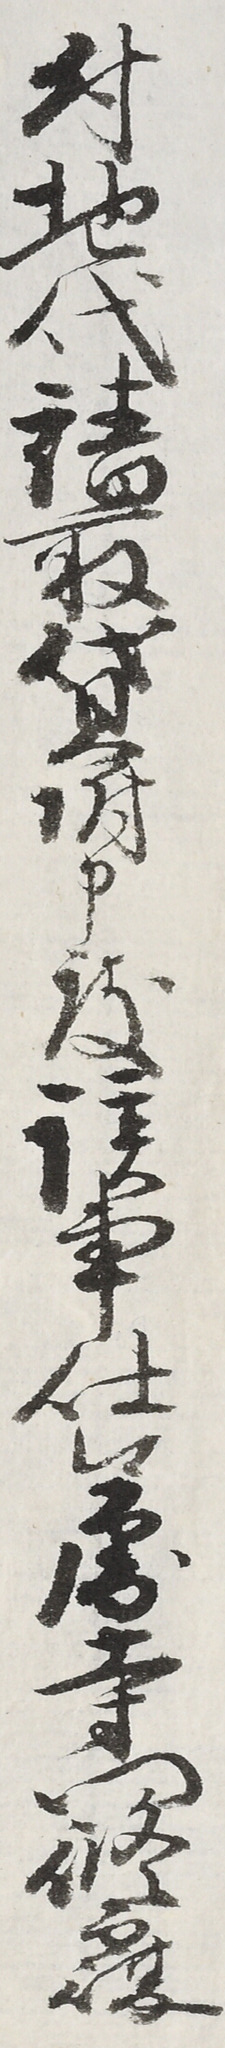月地代請取貸付申度談事仕候処寺門修覆
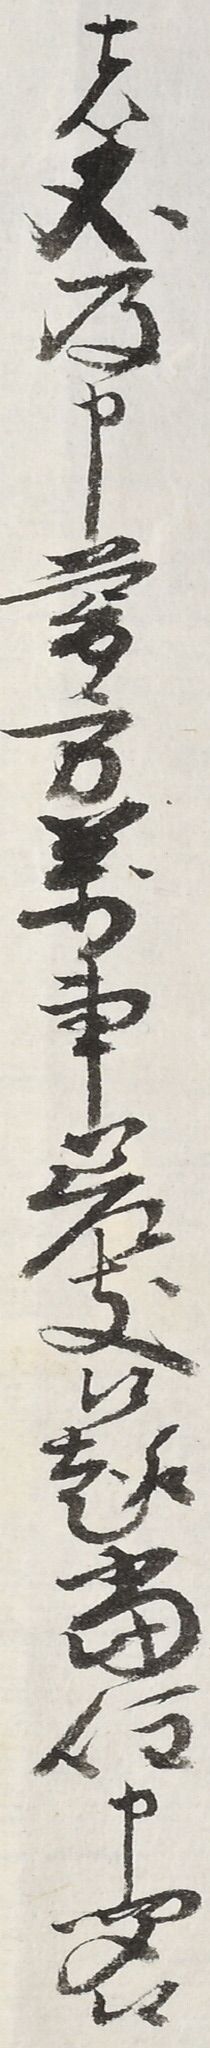者不及申暮方万事差支候趣当住申聞候
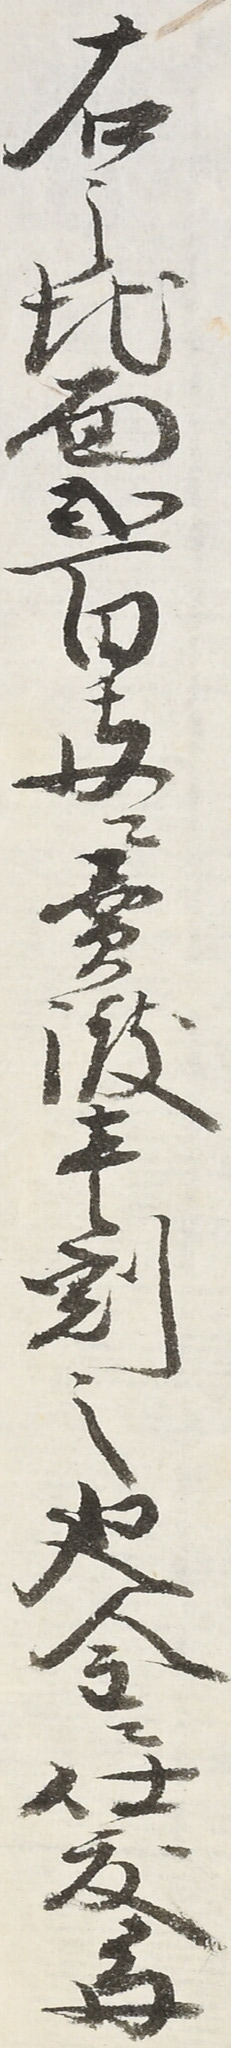右之地面弐百両ニ売渡壱割之廻金ニ仕度多
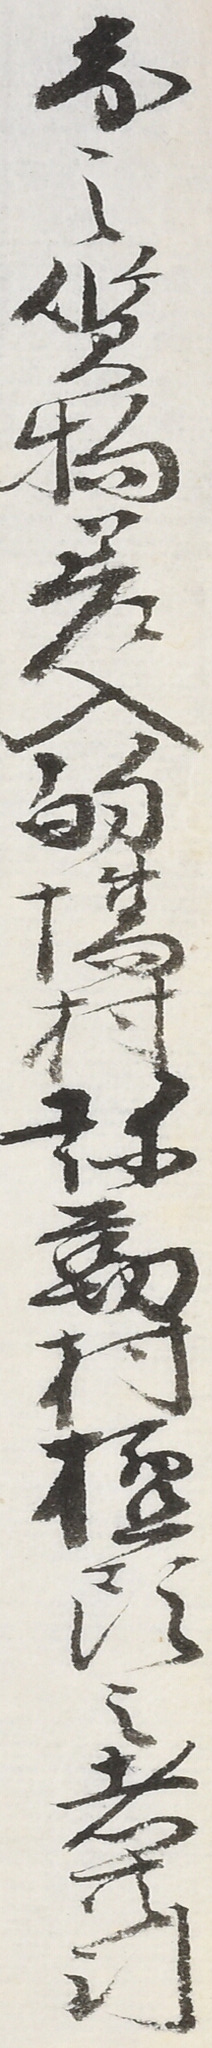分之質物差入的場村弥勒村檀頭之者共引
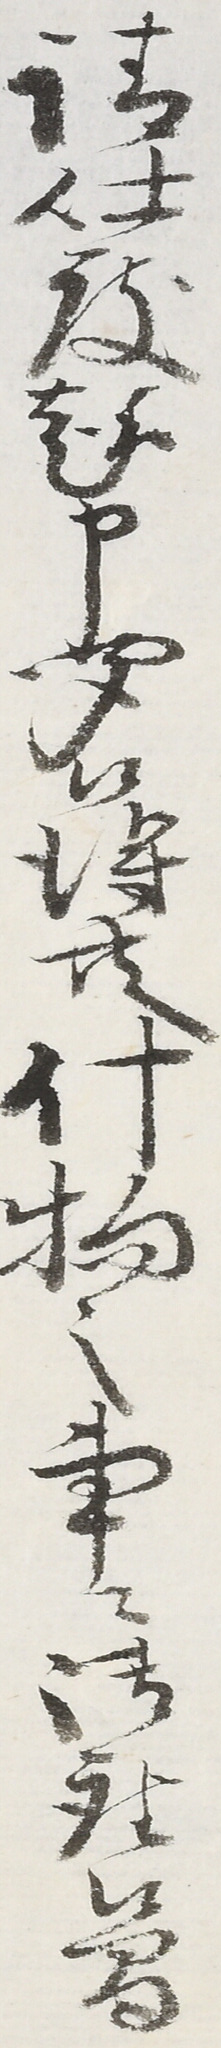請仕度趣申聞候得共什物之事ニ御座候間
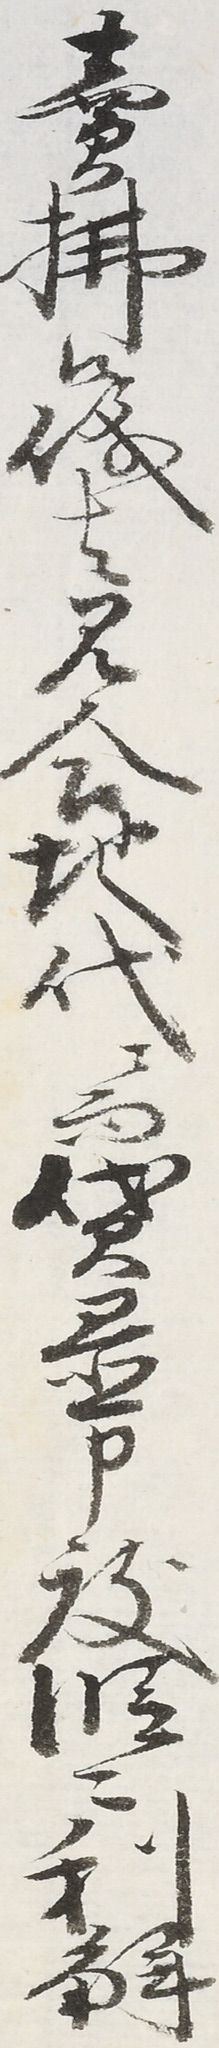売払候儀者見合地代ニ而貸置申度段々利解
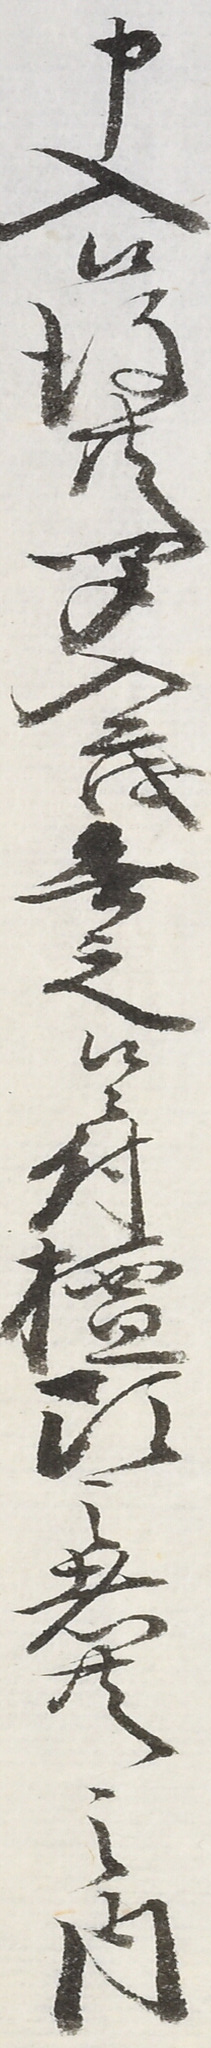申入候得共聞入茂無之候ニ付檀頭之者共之内
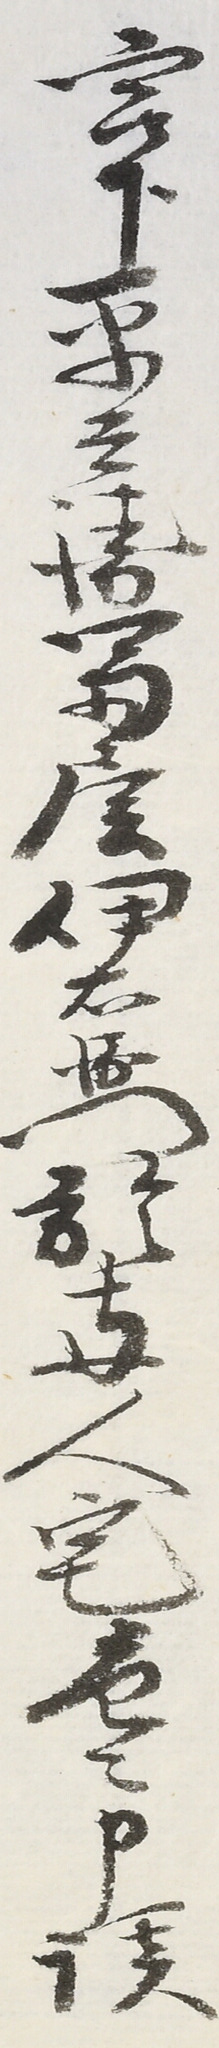宮下平兵衛富屋伊右衛門於両人宅ニ申談
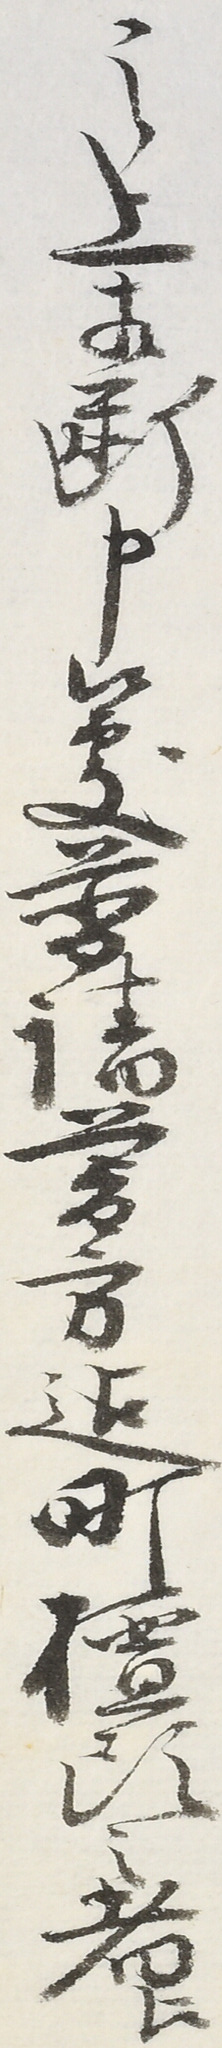之上相断申候処普請暮方迄町檀頭之者江
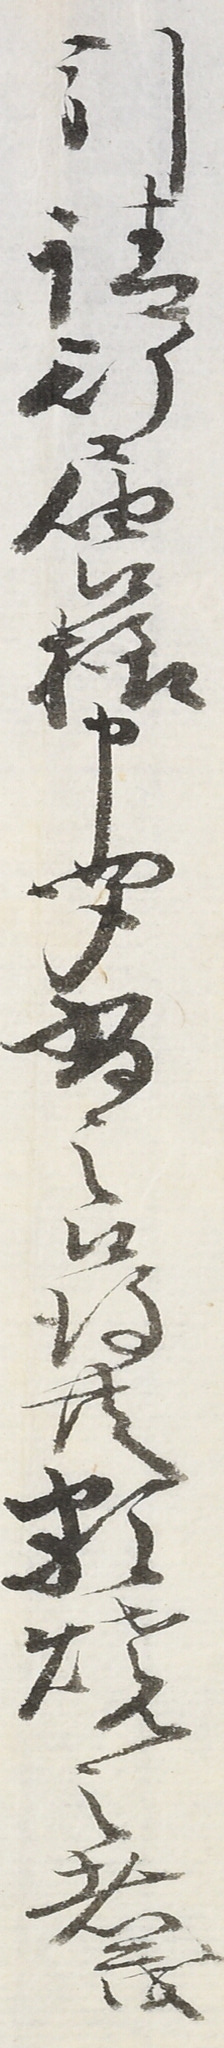引請行届候様申聞有之候得共類焼之者茂
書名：乍恐以口上書奉願上候御事
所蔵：伊那市立高遠町図書館・合同会社AMANE
